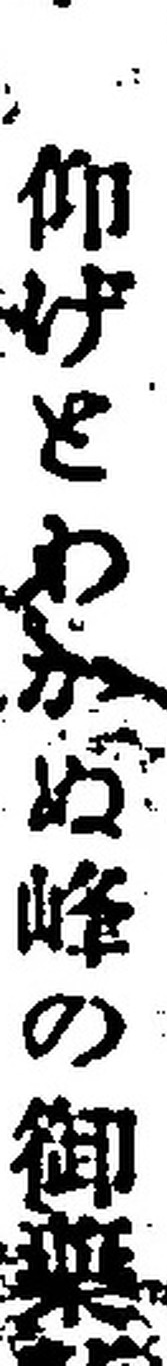仰げとわかぬ峰の御薬師
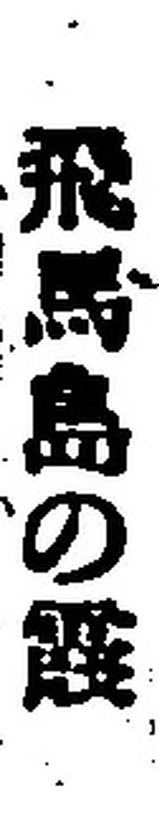飛馬島の霞
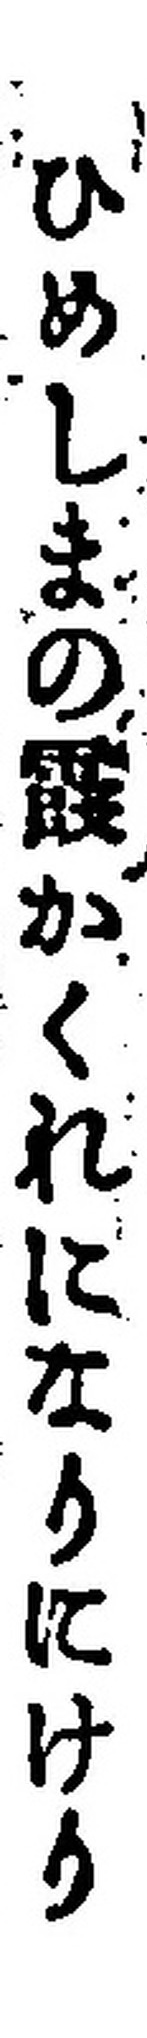ひめしまの霞かくれになりにけり
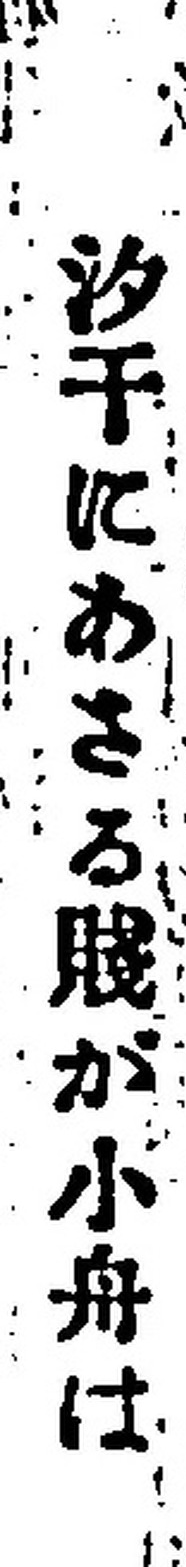汐干にあさる賤が小舟は
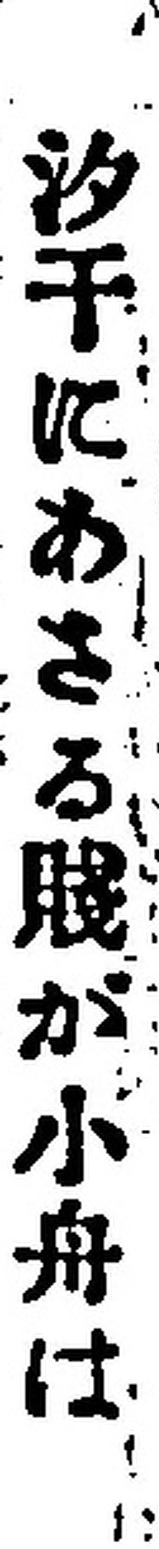汐干にあさる賤が小舟は
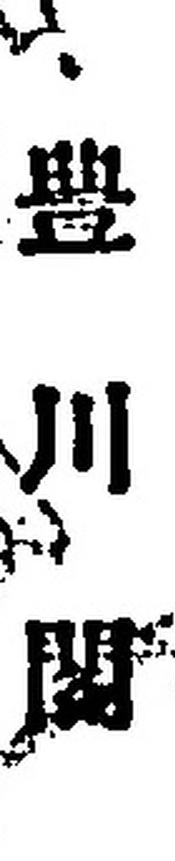豊川閣
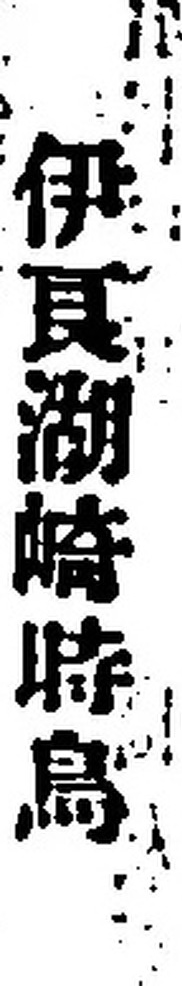伊良湖崎時鳥
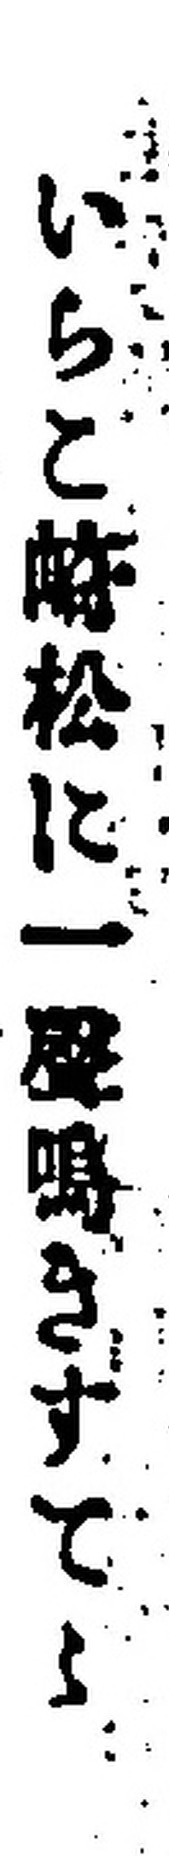いらこ崎松に一声鳴きすてゝ
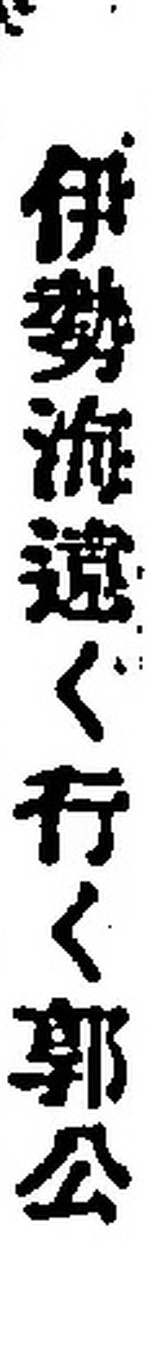伊勢海遠く行く郭公
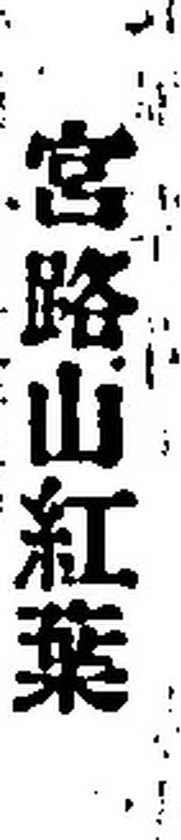宮路山紅葉
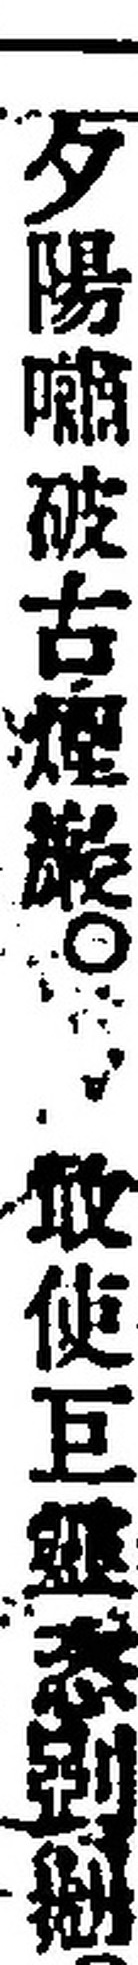夕陽嘯破古煙巌。敢使巨霊恣。斜抱
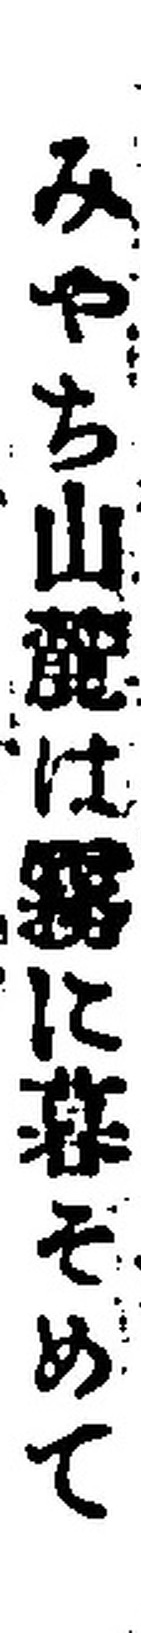みやち山麓は霧に暮そめて
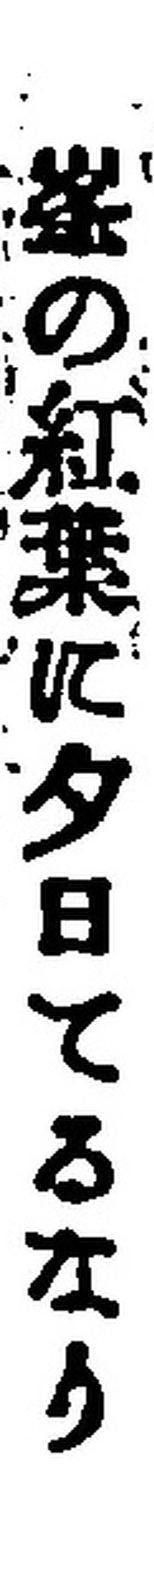峯の紅葉に夕日てるなり
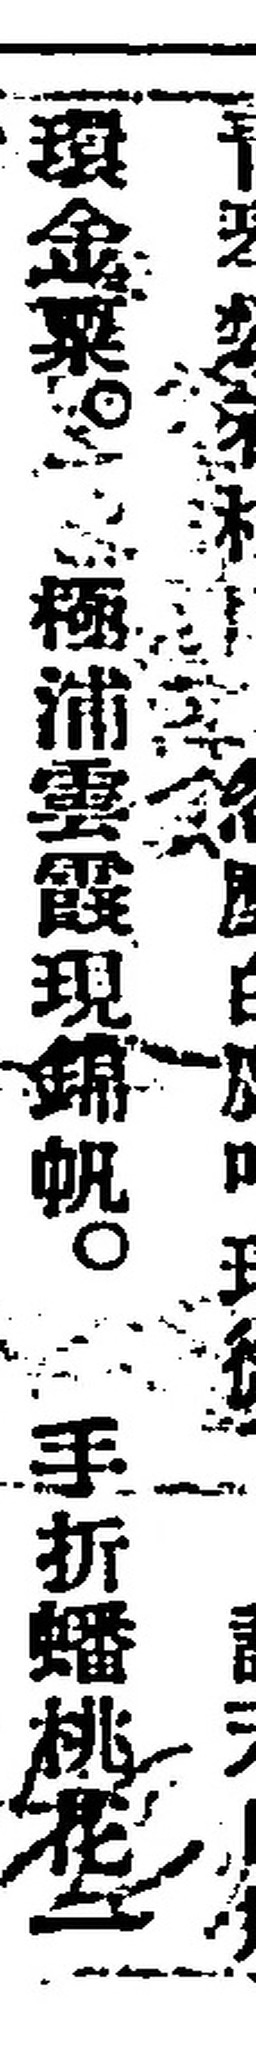環金粟。極浦雲霞現錦帆。手折蟠桃花一

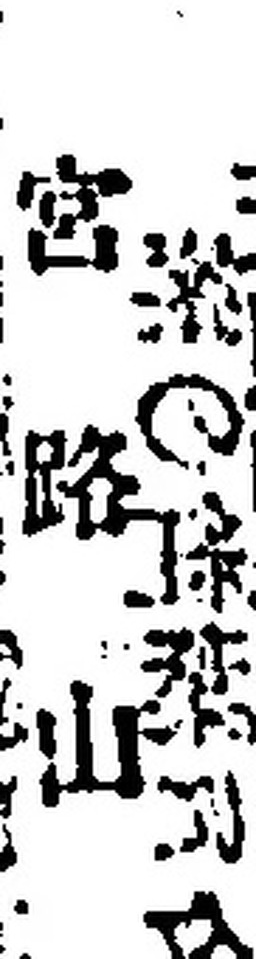宮路山
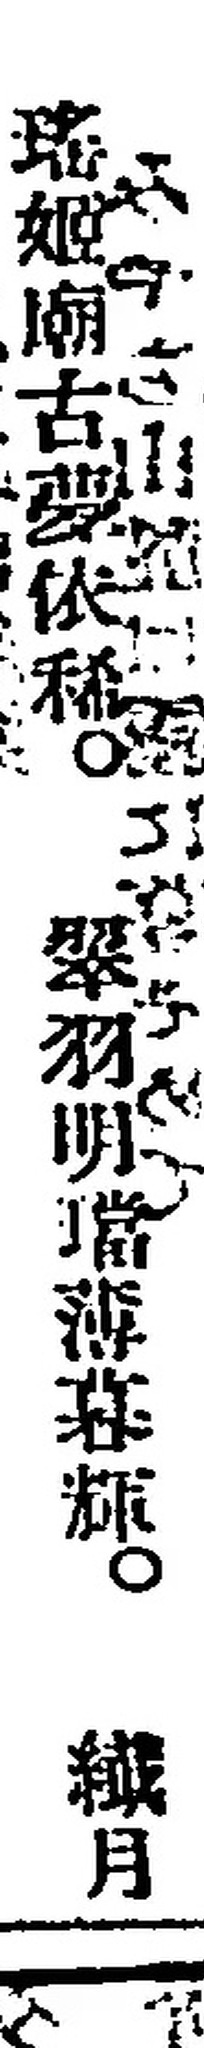瑤姫廟古夢依稀。翠羽明璫薄暮輝。繊月
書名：東参名勝案内
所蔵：国立国会図書館 National Diet Library, JAPAN
